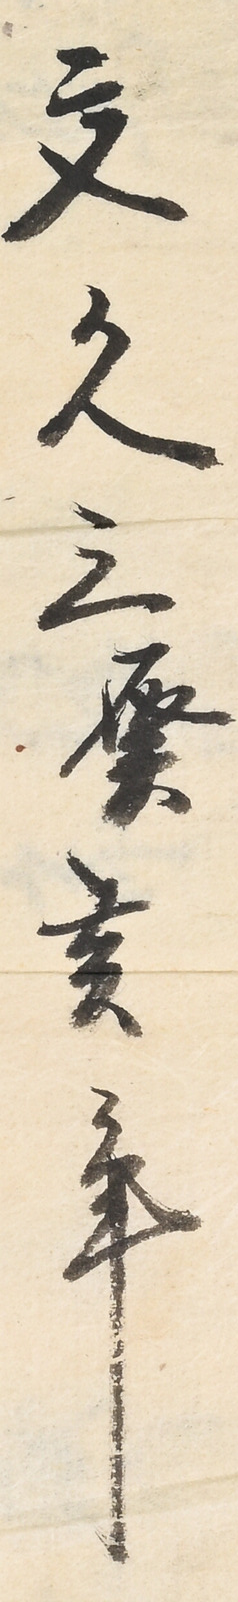㊞文久三癸亥年
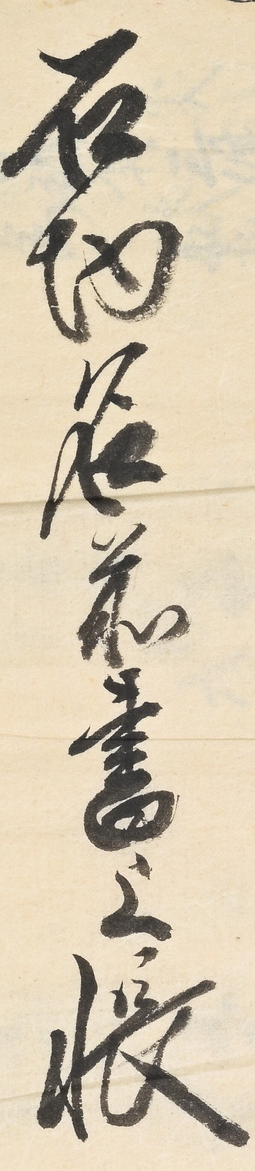石切名前書上帳

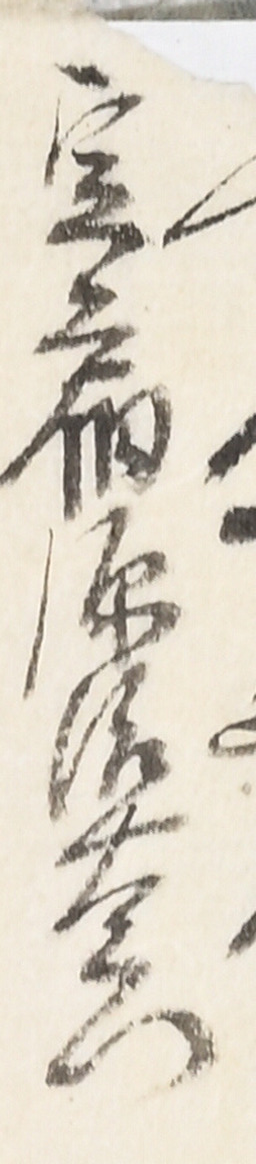宿源治右衛門
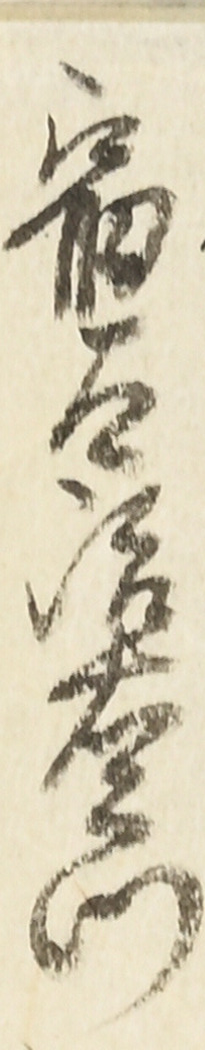宿源治右衛門
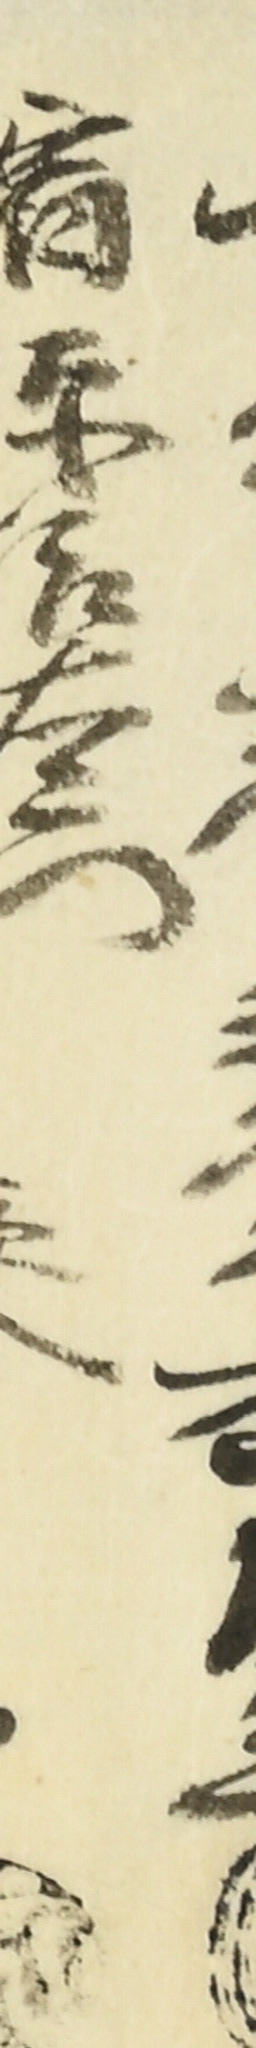宿源治右衛門

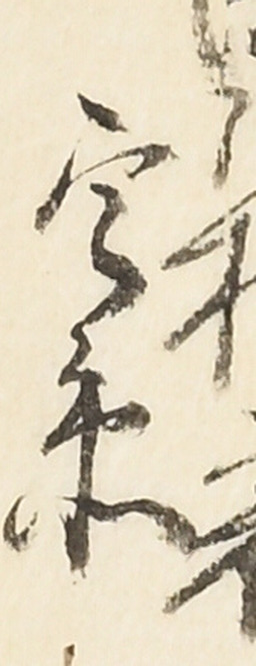宇兵衛

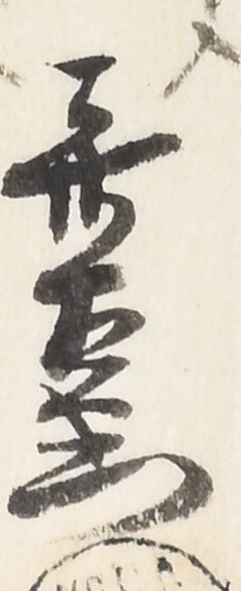茂右衛門
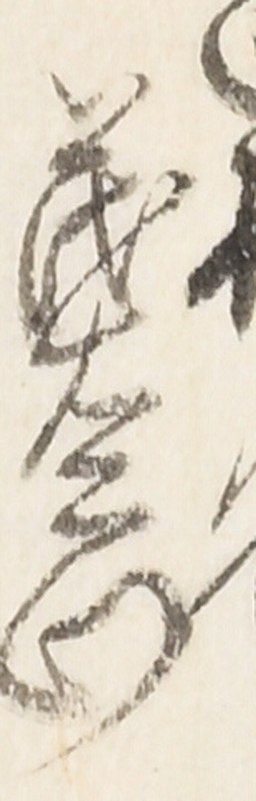茂右衛門

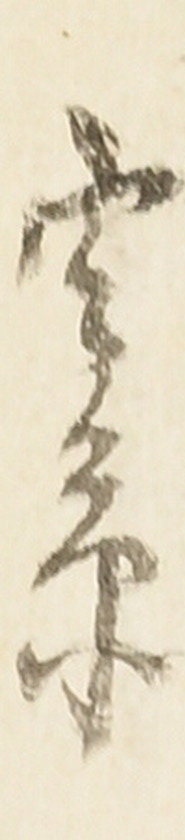宇兵衛

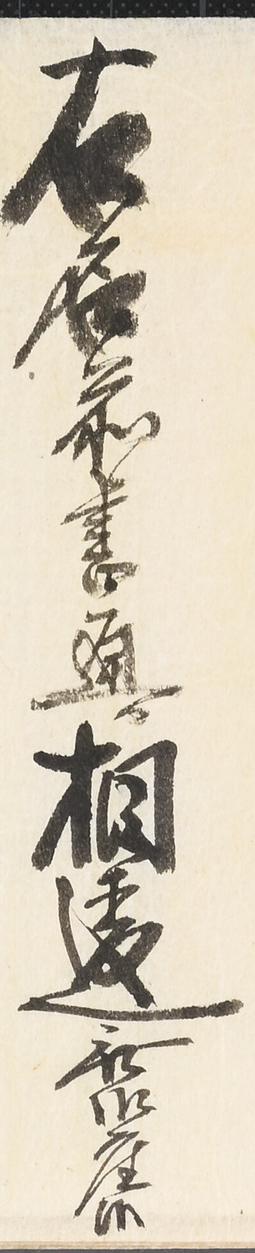右名前書通り相違無御座候
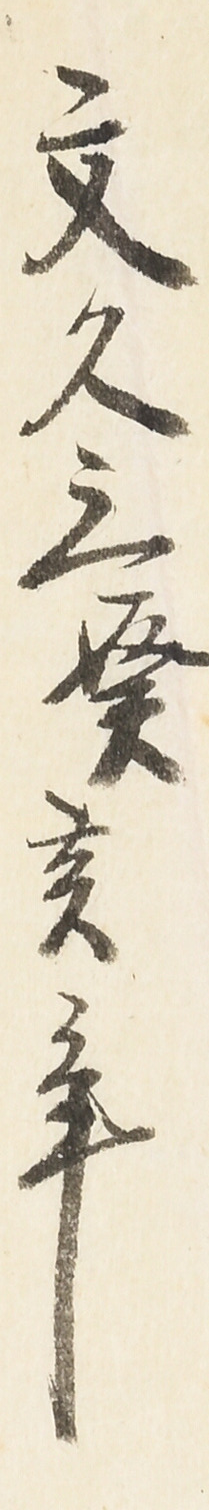文久三癸亥年
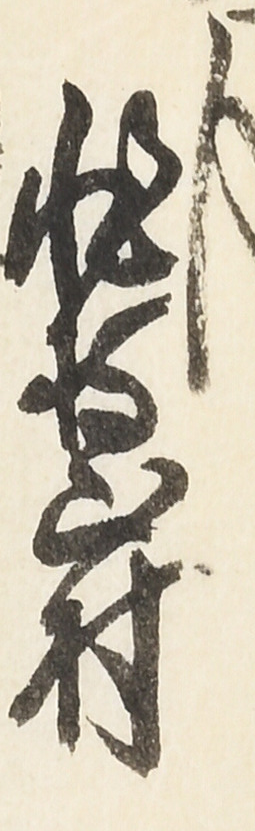非持山村

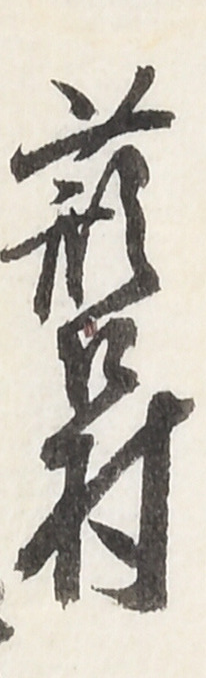荊口村
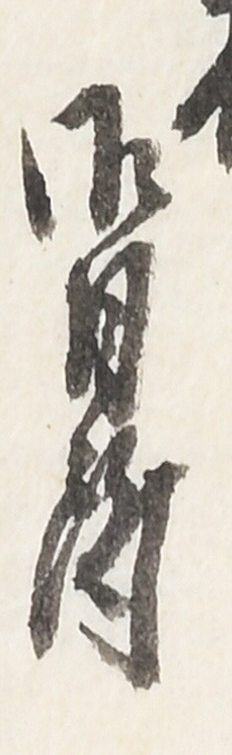御目附
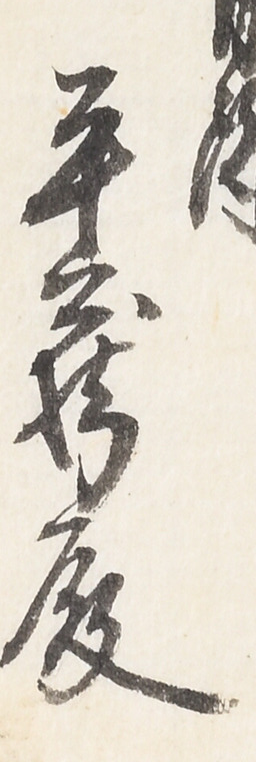平蔵殿
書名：文久三癸亥年正月石切名前書上帳
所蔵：伊那市立高遠町図書館・合同会社AMANE
